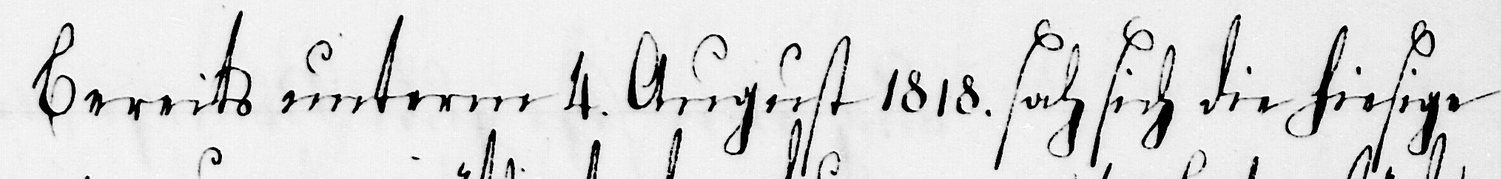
Bereits unterm 4. August 1818. sah sich die hiesige
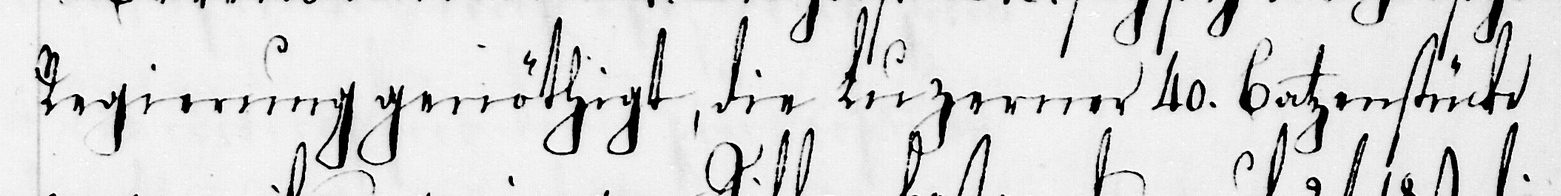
Regierung genöthigt, die Luzerner 40. Batzenstücke
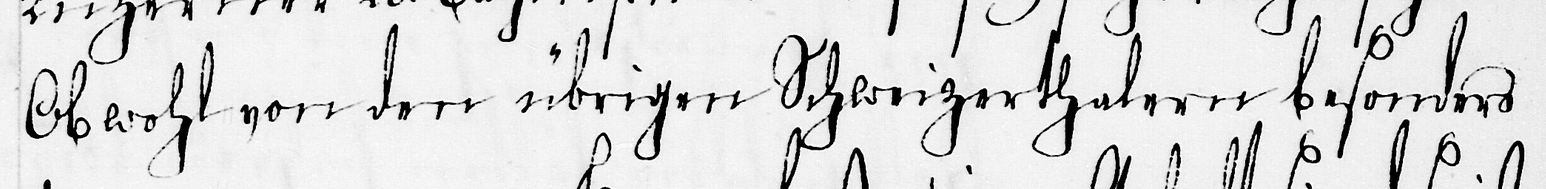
Obwohl von den übrigen Schweizerthalern besonders
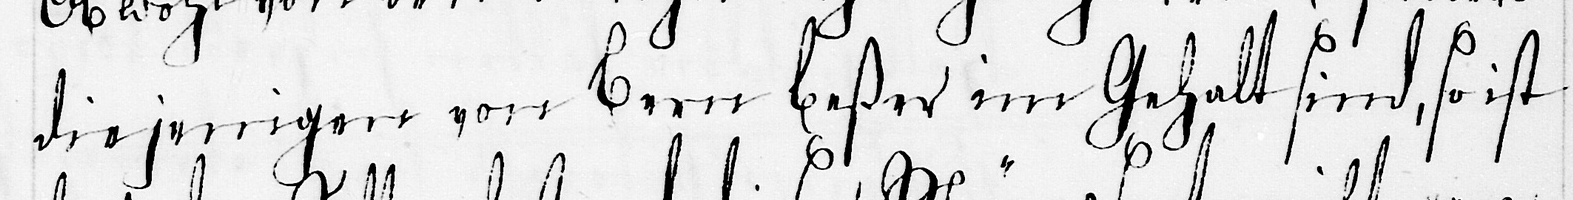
diejenigen von Bern beßer im Gehalt sind, so ist
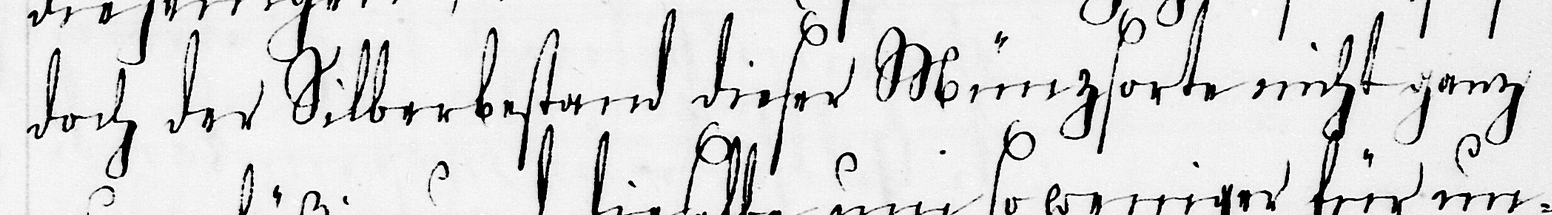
doch der Silberbestand dieser Münzsorte nicht ganz
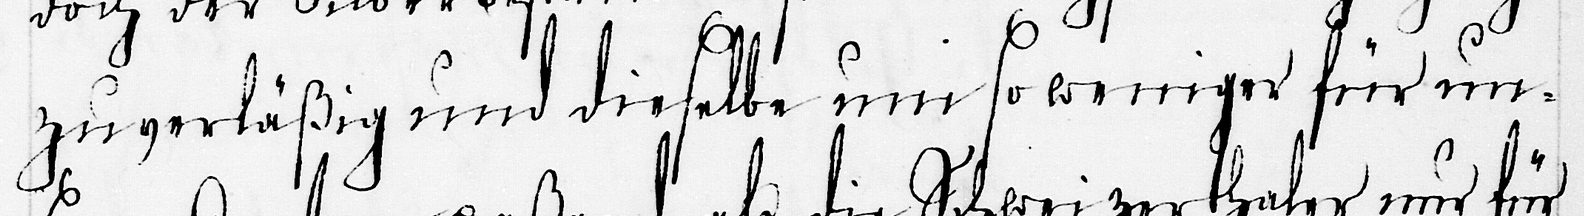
zuverläßig und dieselbe um so weniger für un¬
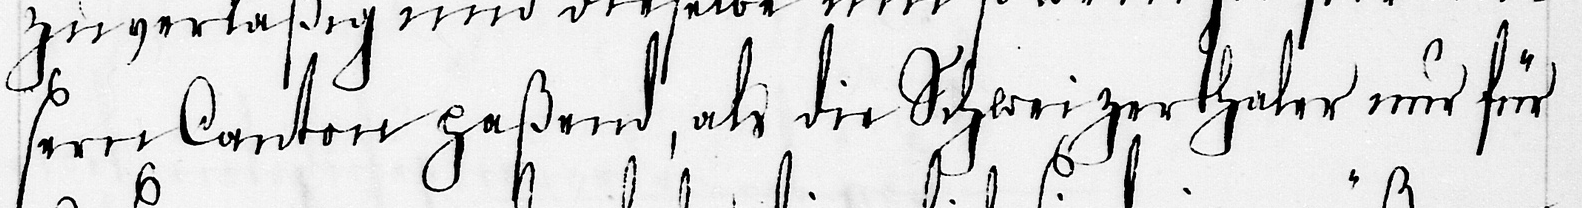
sern Canton paßend, als die Schweizerthaler nur für
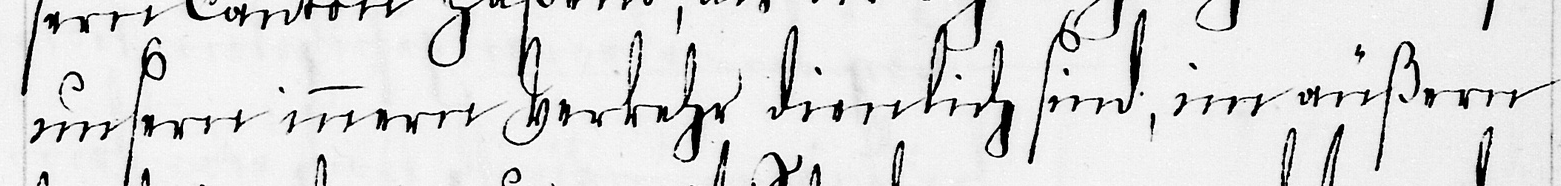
unsern innern Verkehr dienlich sind, im äußern
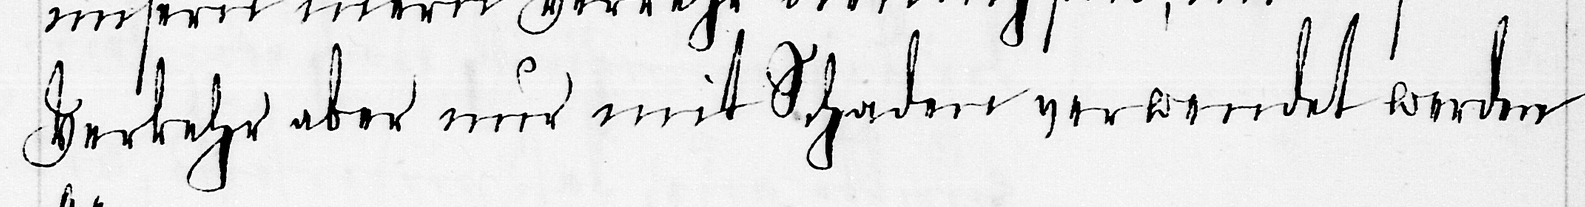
Verkehr aber nur mit Schaden verwendet werden
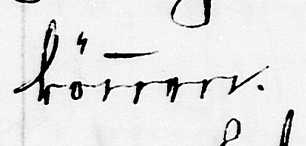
können.
